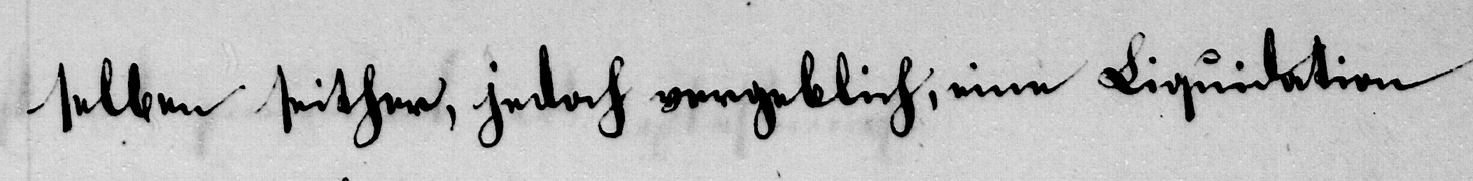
selben seither, jedoch vergeblich, eine Liquidation
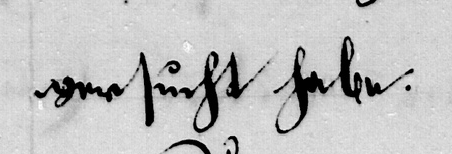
versucht habe.
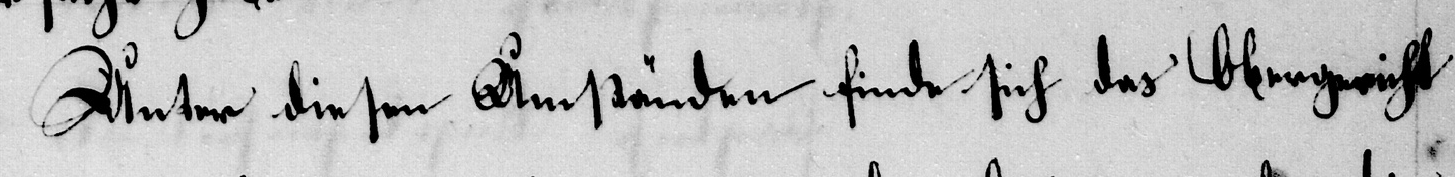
Unter diesen Umständen finde sich das Obergericht
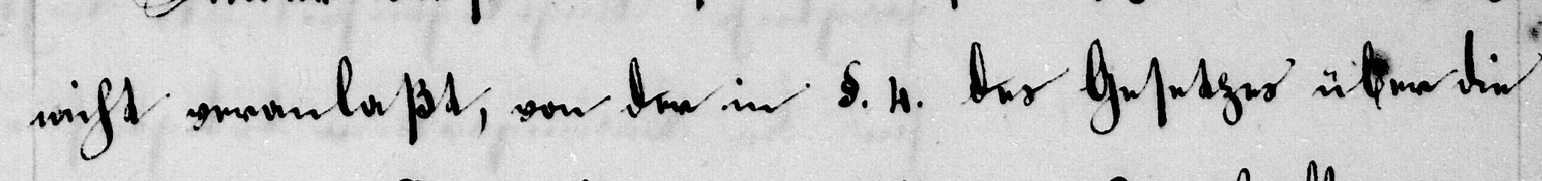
nicht veranlaßt, von der in §. 4. des Gesetzes über die
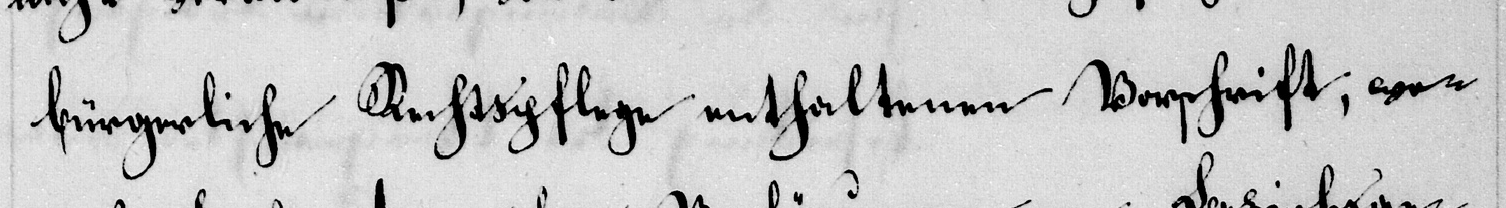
bürgerliche Rechtspflege enthaltenen Vorschrift, wo¬
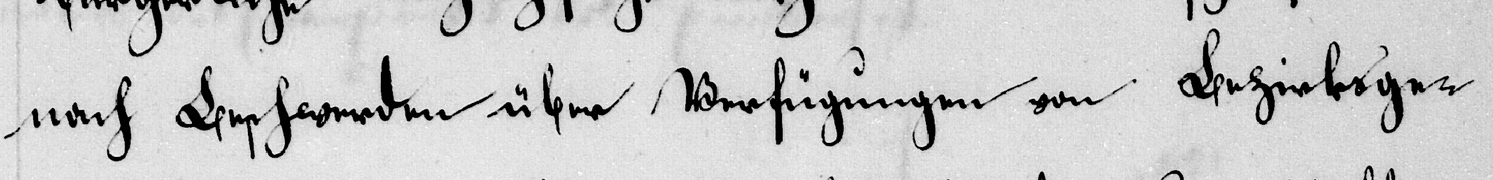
nach Beschwerden über Verfügungen von Bezirksge¬
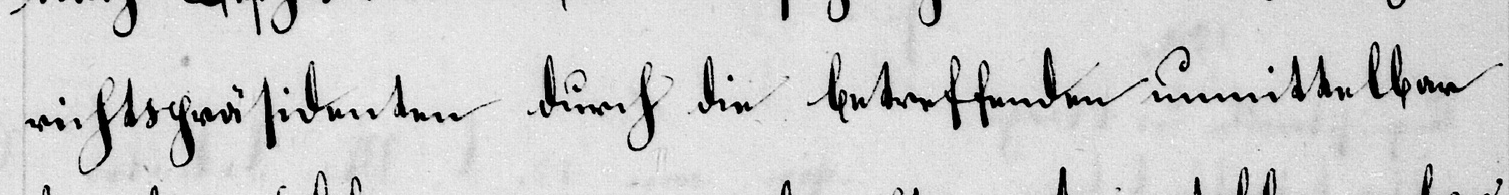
richtspräsidenten durch die betreffenden unmittelbar
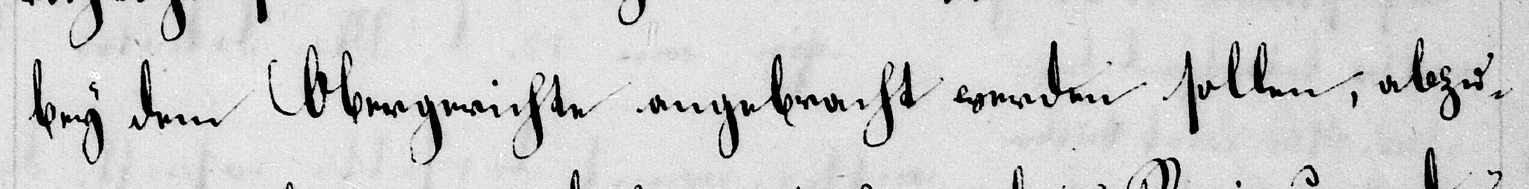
bey dem Obergerichte angebracht werden sollen, abzu¬
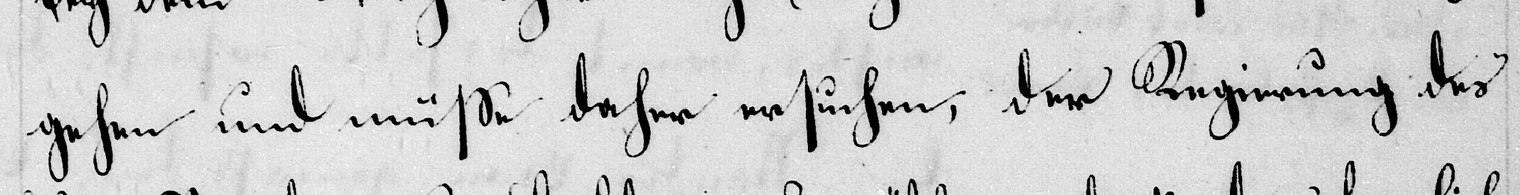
gehen und müße daher ersuchen, der Regierung des
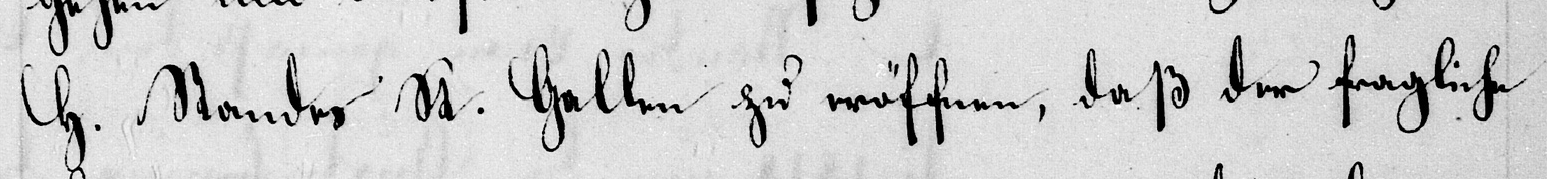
H. Standes St. Gallen zu eröffnen, daß der fragliche
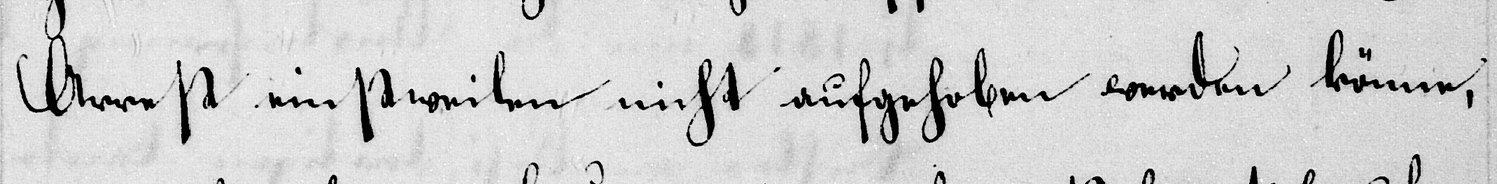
Arrest einstweilen nicht aufgehoben werden könne,
